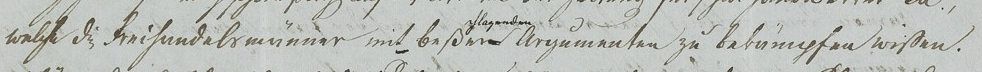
welche die Freihandelsmänner mit beßernschlagenden Argumenten zu bekämpfen wissen.
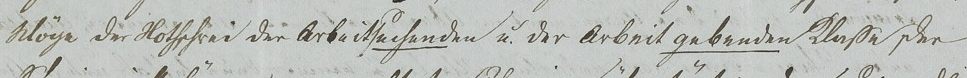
Möge der Nothschrei der Arbeitsuchenden u. der Arbeitgebenden Klasse der
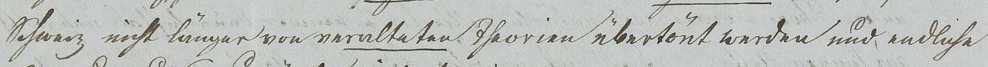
Schweiz nicht länger von veralteten Theorien übertönt werden und endliche
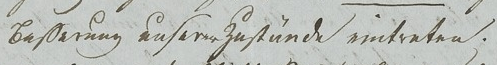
Besserung unserer Zustände eintreten.
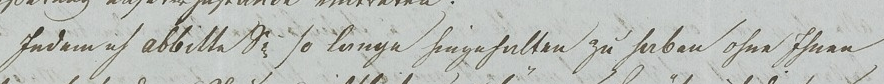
Indem ich abbitte Sie so lange hingehalten zu haben ohne Ihnen
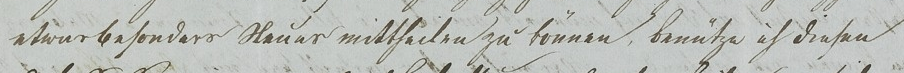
etwas besonders Neues mittheilen zu können, benütze ich diesen
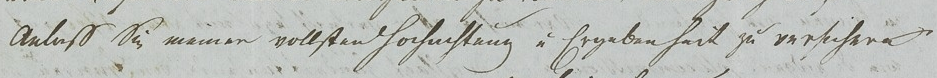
Anlaß Sie meiner vollsten Hochachtung u Ergebenheit zu versichern
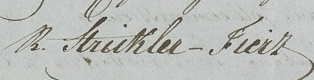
R. Strickler-Fierz
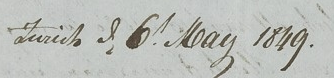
Zürich den 6t May 1849.
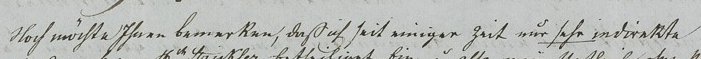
Noch möchte Ihnen bemerken, daß ich seit einiger Zeit nur sehr indirekte
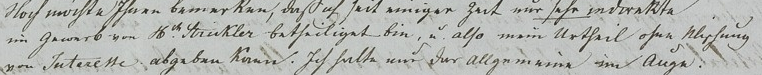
im Gewerb von Hch Strickler betheiliget bin, u. also mein Urtheil ohne Mischung
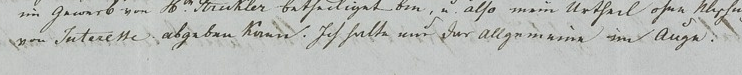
von Interesse abgeben kann. Ich halte nur das Allgemeine im Auge.
